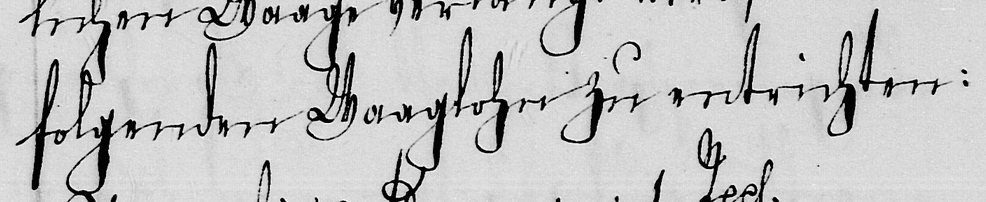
folgenden Waaglohn zu entrichten:
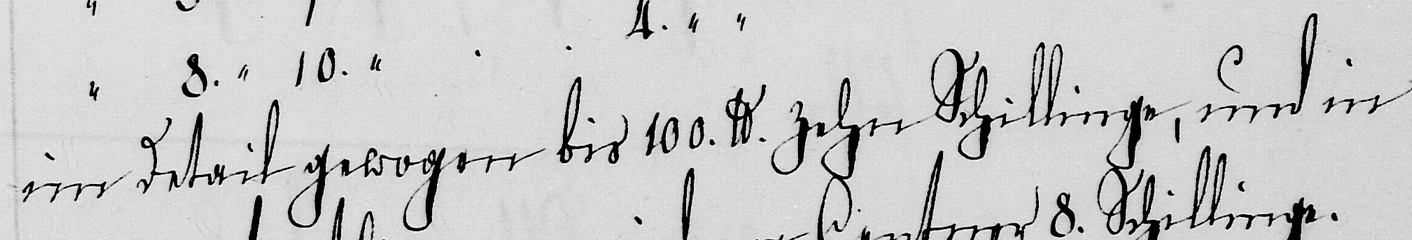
im Detail gewogen bis 100. lb. zehn Schillinge, und in
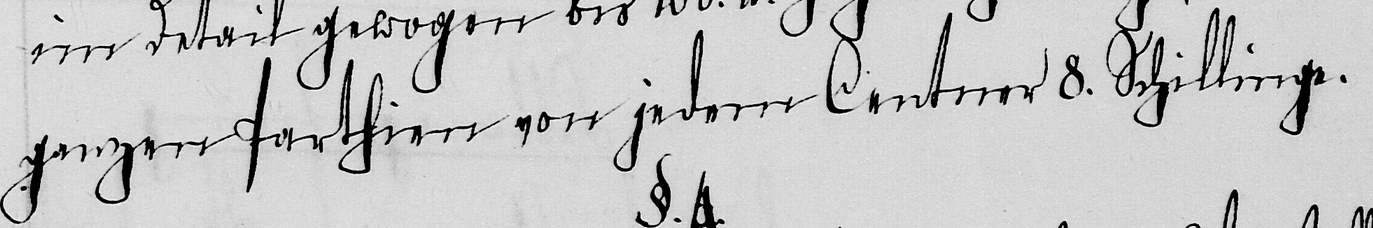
ganzen Parthien von jedem Centner 8. Schillinge.
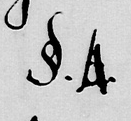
§. 4.
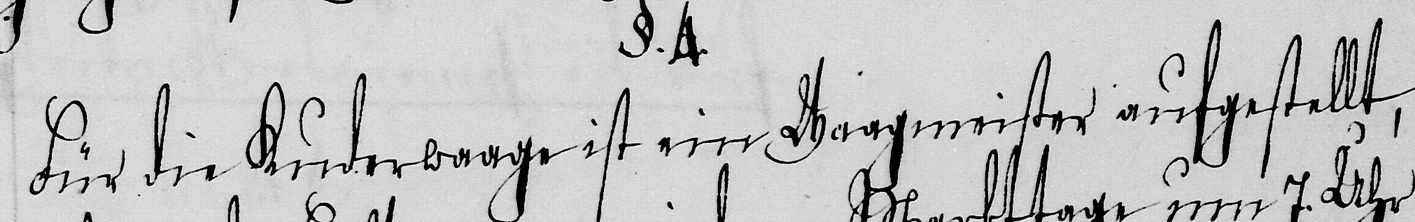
Für die Kuderwaage ist ein Waagmeister aufgestellt,
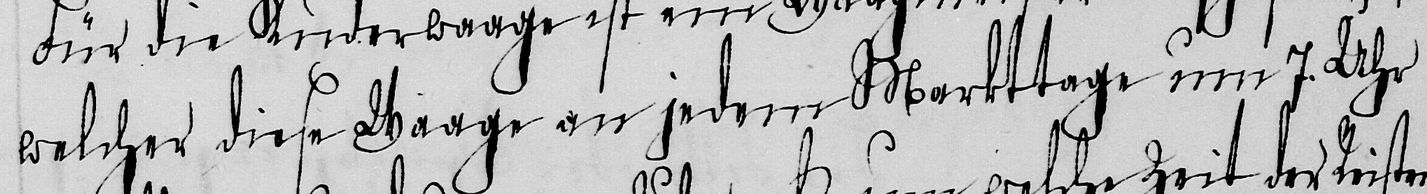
welcher diese Waage an jedem Markttage um 7. Uhr
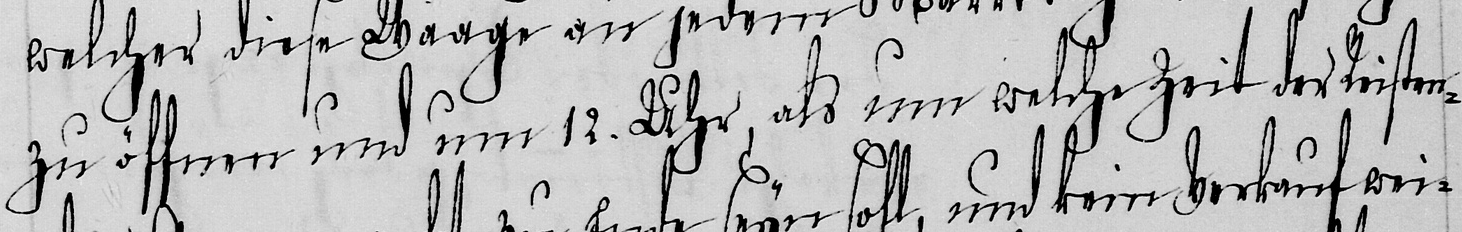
zu öffnen und um 12. Uhr, als um welche Zeit der Reisten-
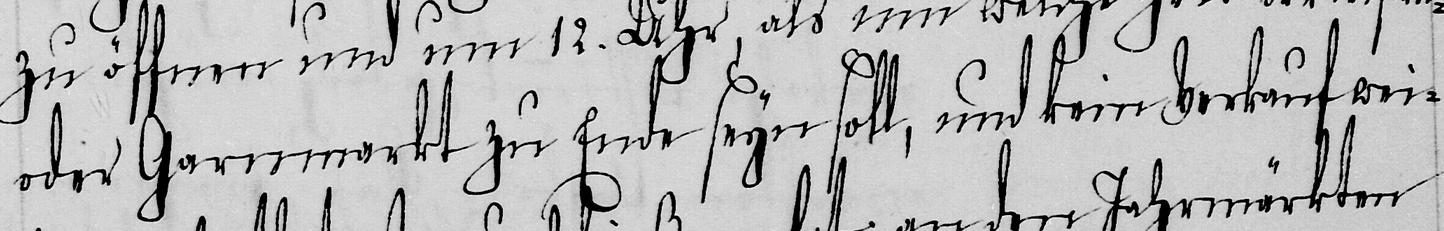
oder Garnmarkt zu Ende seyn soll, und kein Verkauf wei¬
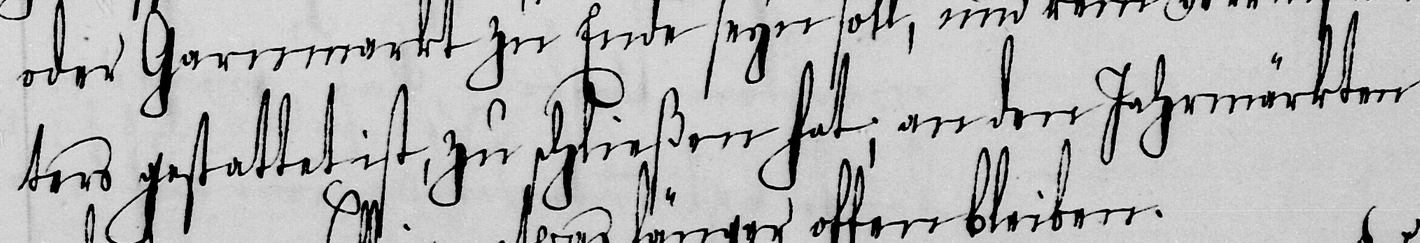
gestattet ist, zu schließen hat; an den Jahrmärkten
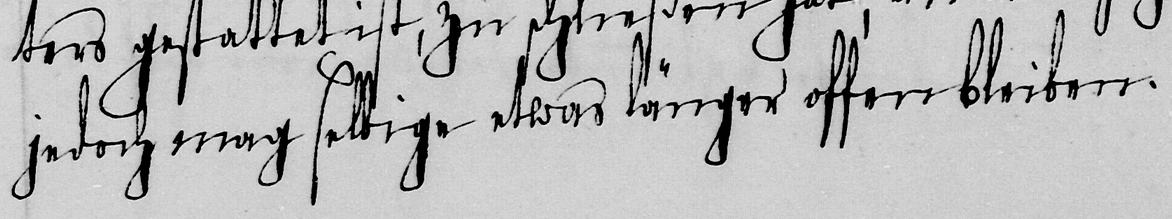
jedoch mag selbige etwas länger offen bleiben.
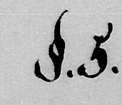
ters
